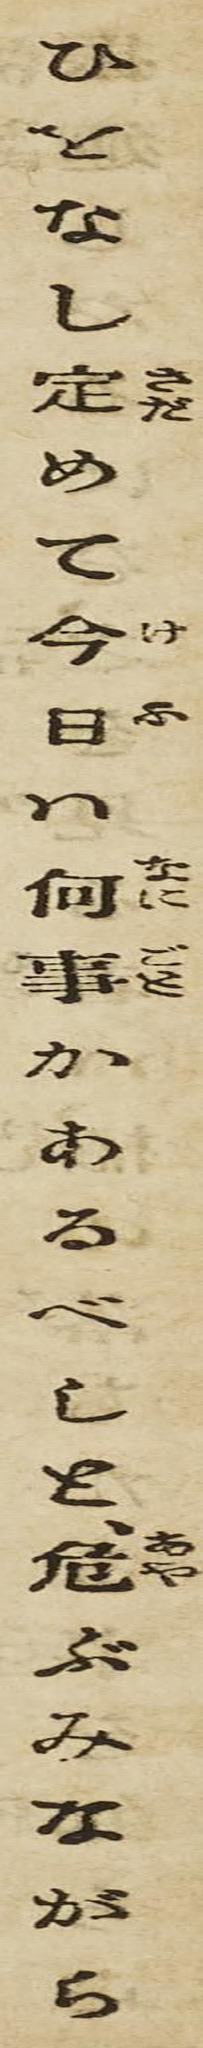ひをなし定めて今日は何事かあるべしと、危ぶみながら
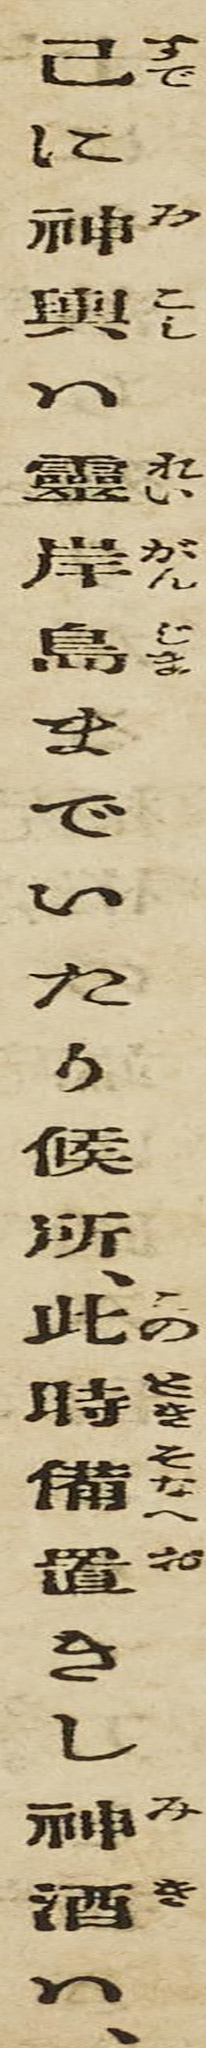已に神輿は霊岸島までいたり候所、此時備置きし神酒は、
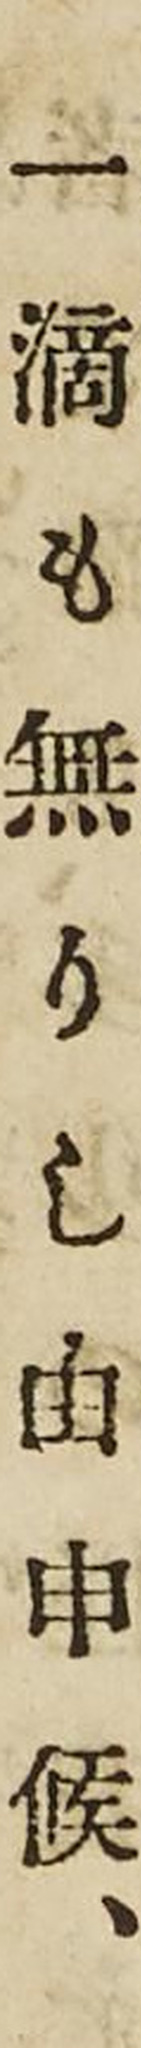一滴も無りし由申候、
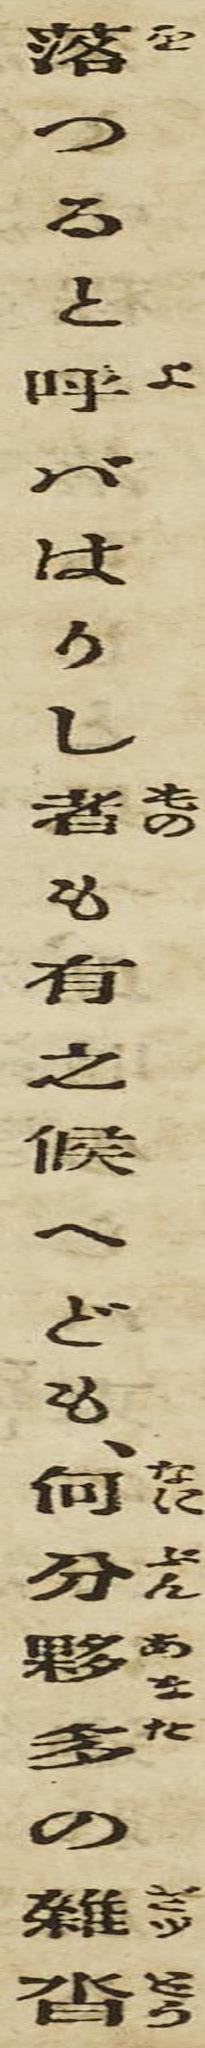落つると呼ばはりし者も有之候へども、何分夥多の雑沓
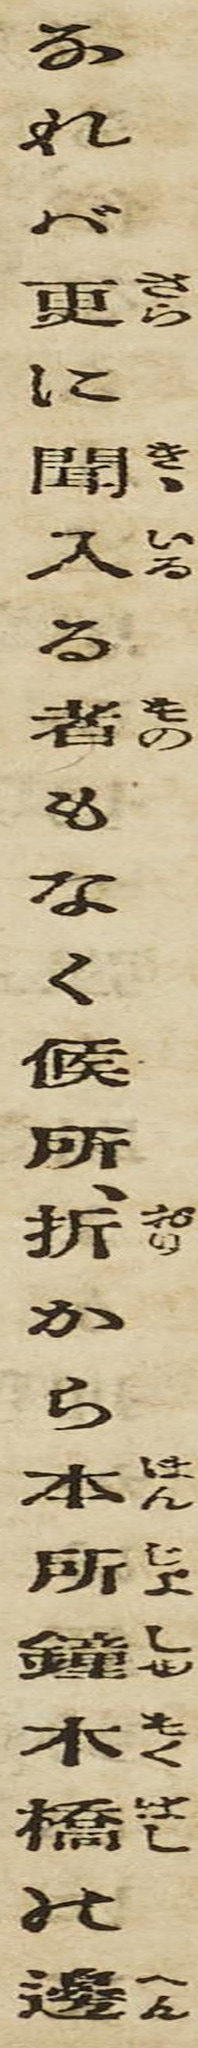なれば更に聞入る者もなく候所、折から本所鐘木橋の辺
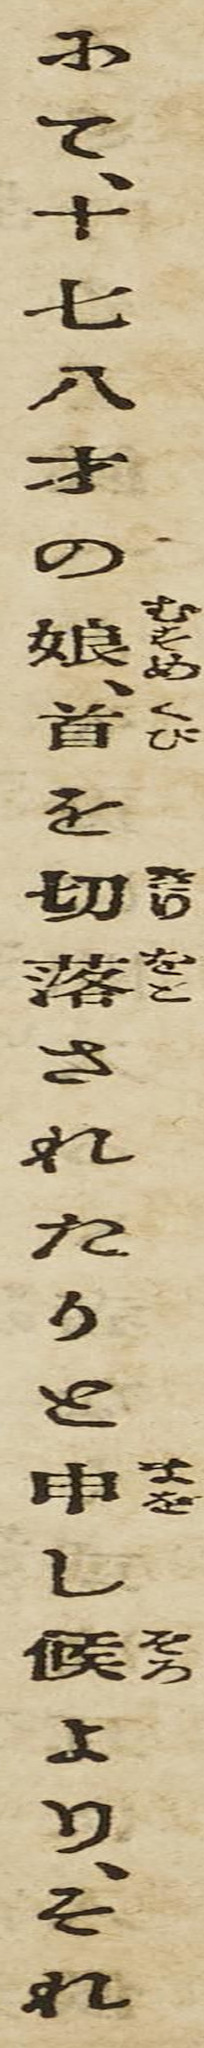にて、十七八才の娘、首を切落されたりと申し候より、それ
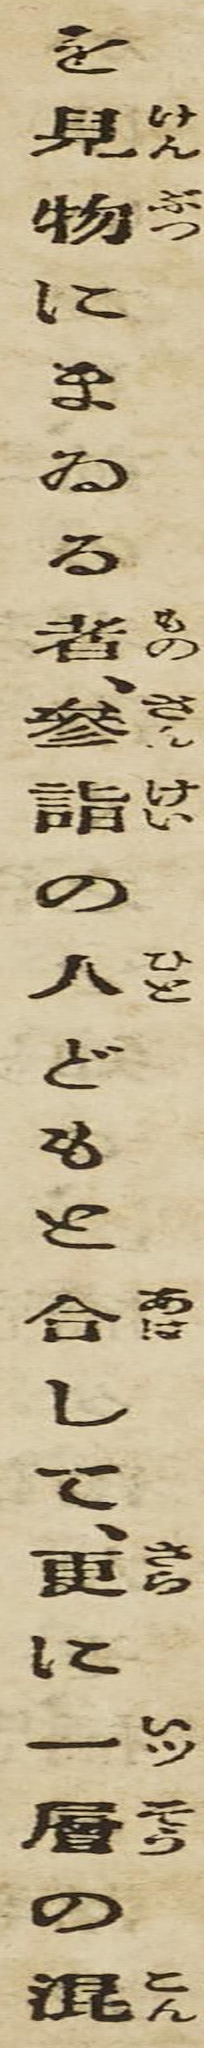を見物にまゐる者、参詣の人どもと合して、更に一層の混
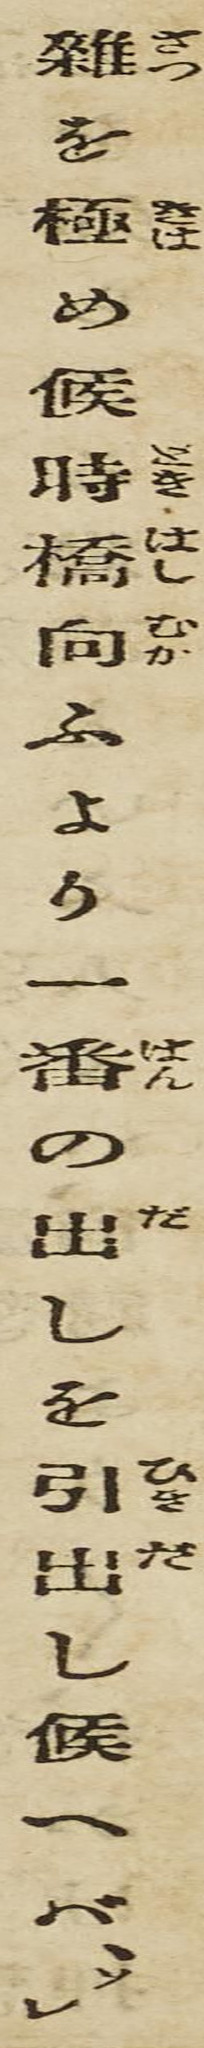雑を極め候時橋向ふより一番の出しを引出し候へば、ソレ
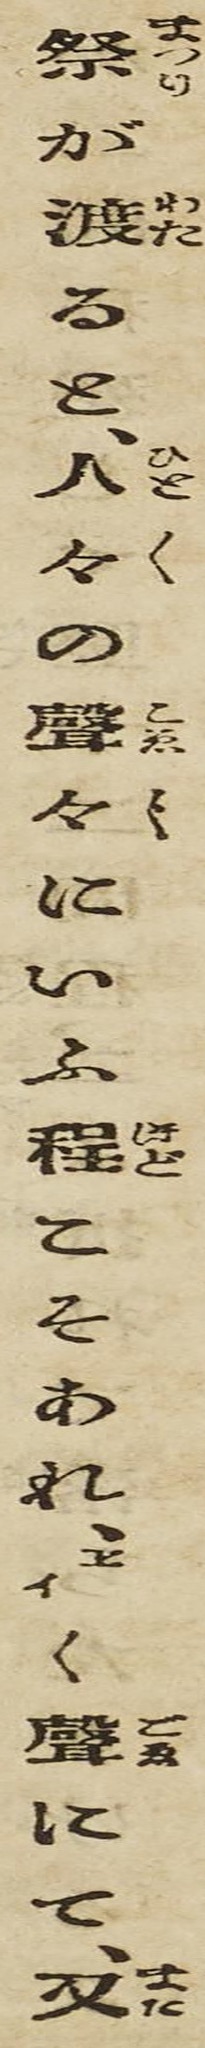祭が渡ると、人々の声々にいふ程こそあれ、ヱイ〳〵声にて、又
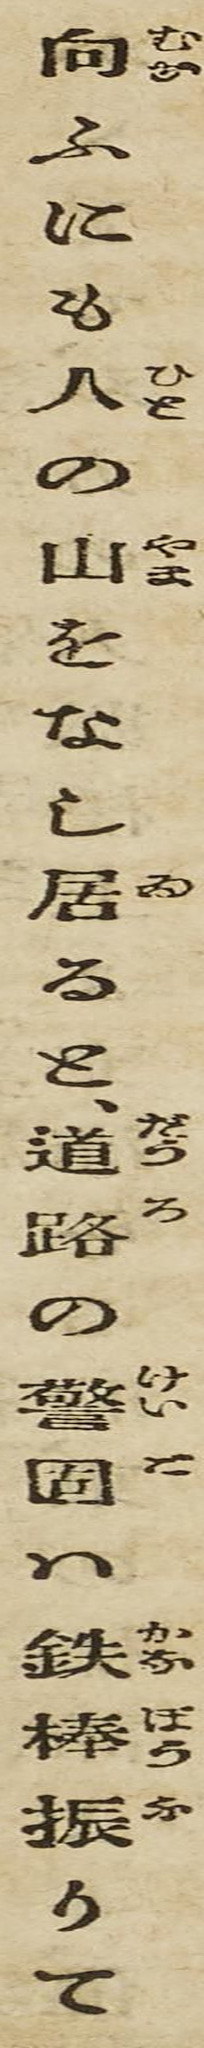向ふにも人の山をなし居ると、道路の警固は鉄棒振りて
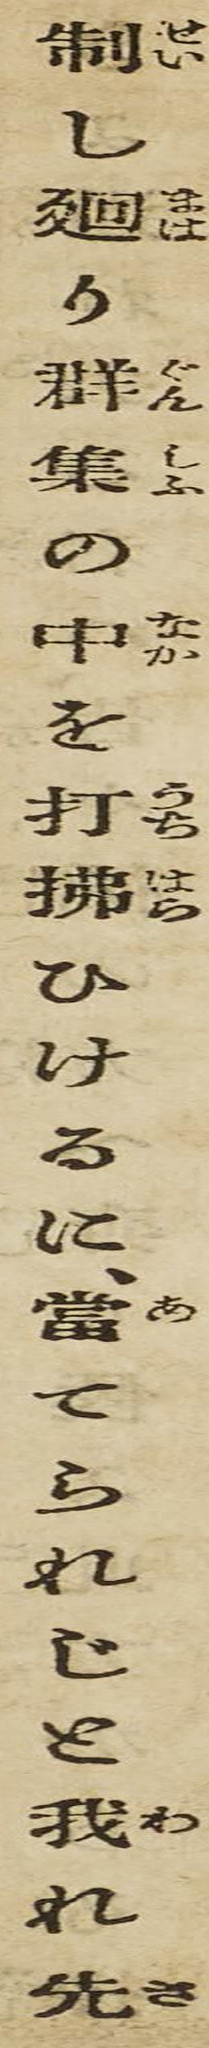制し廻り群集の中を打払ひけるに、当てられじと我れ先

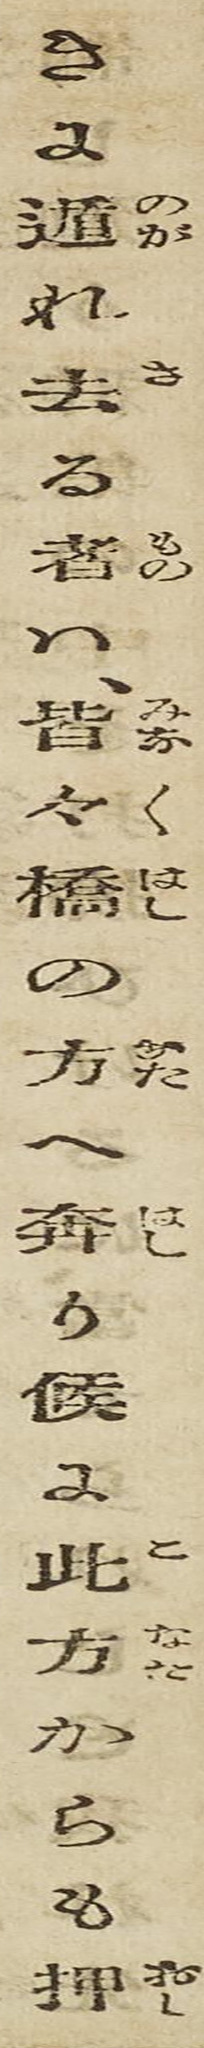きに遁れ去る者は、皆々橋の方へ奔り候に此方からも押
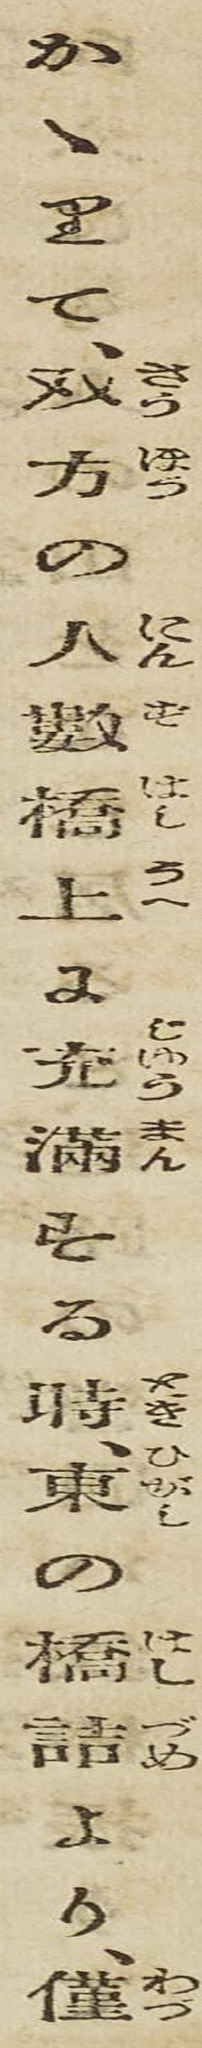かゝりて、双方の人数橋上に充満する時、東の橋詰より、僅
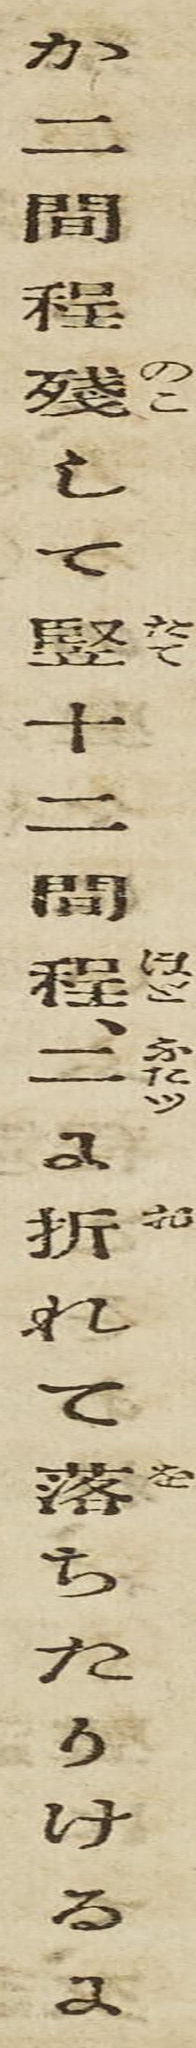か二間程残して竪十二間程、二に折れて落ちたりけるに
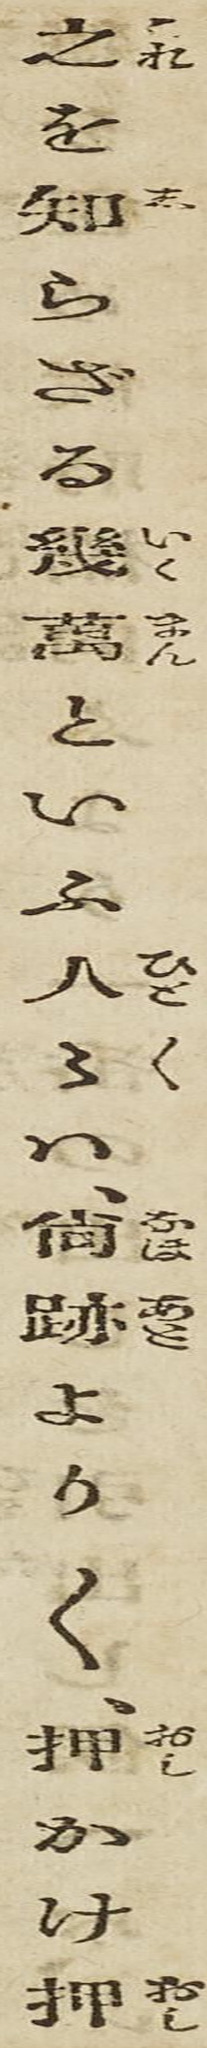之を知らざる幾万といふ人々は、尚跡より〳〵、押かけ押
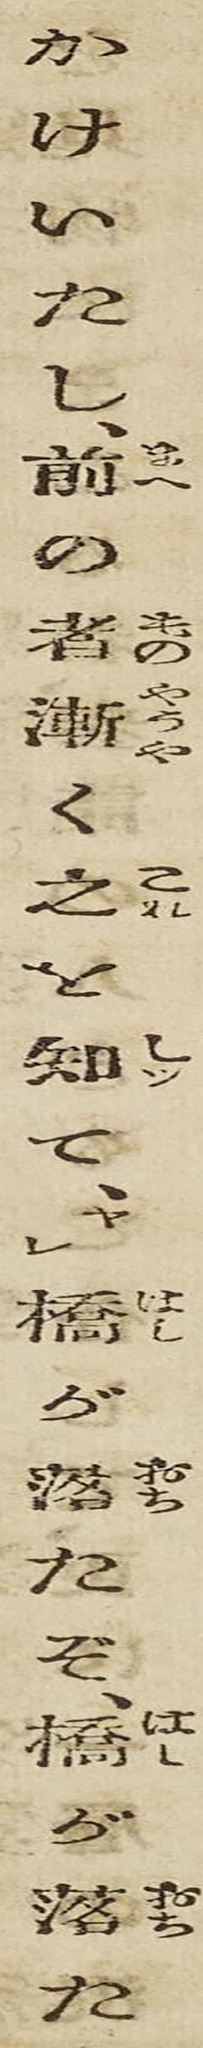かけいたし、前の者漸く之を知て、ヤレ橋が落たぞ、橋が落た
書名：永代惨話　文化の夢　全
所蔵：東京大学地震研究所図書室 Earthquake Research Institute Library, The University of Tokyo, JAPAN
